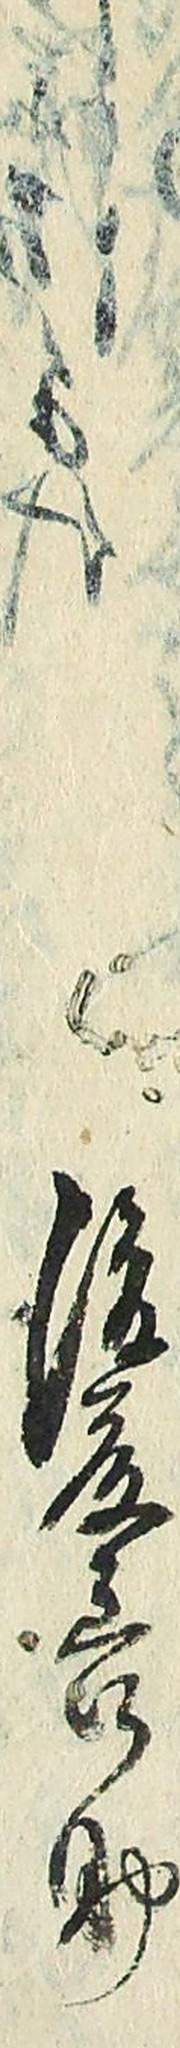後藤善助
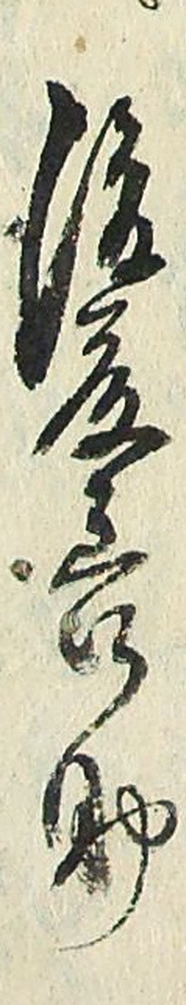後藤善助

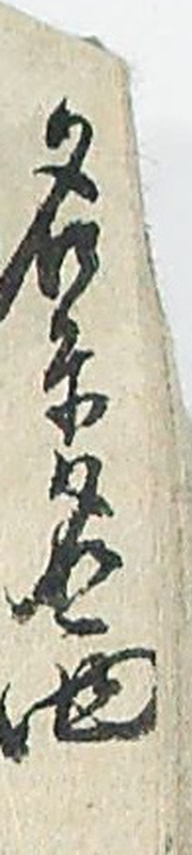名東名西
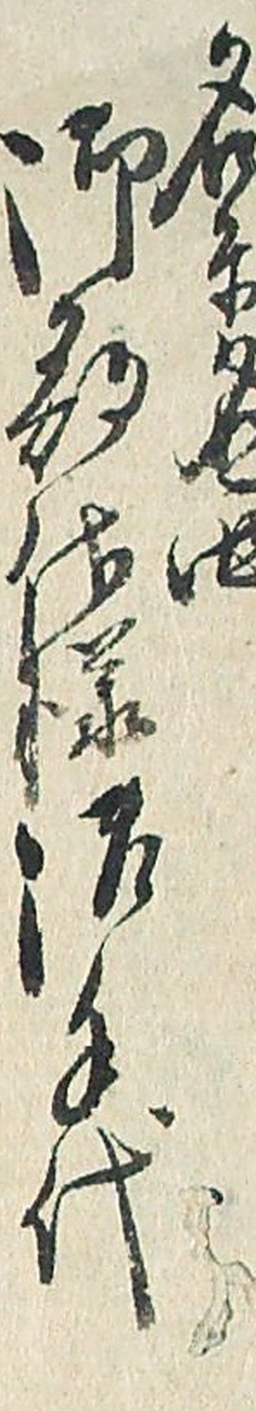御郡代様御手代
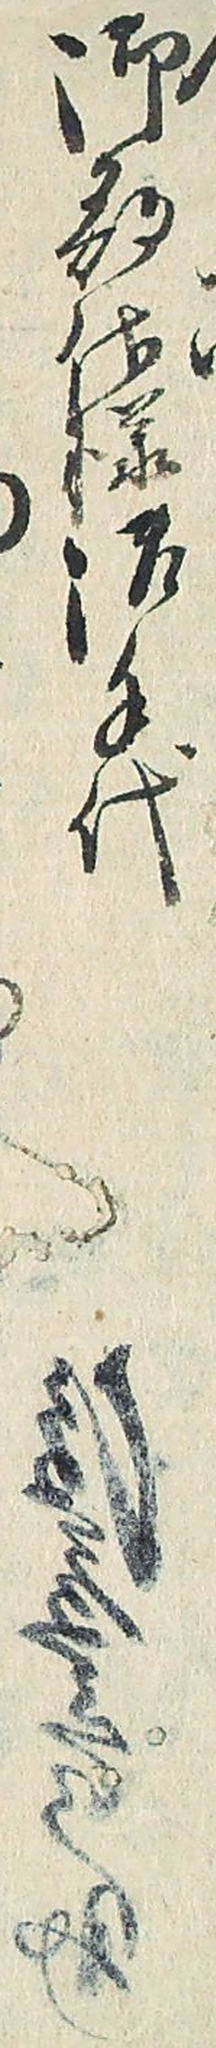御郡代様御手代
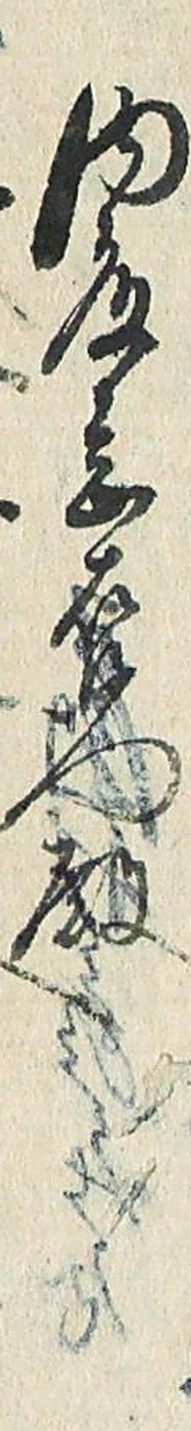内藤甚右衛門殿
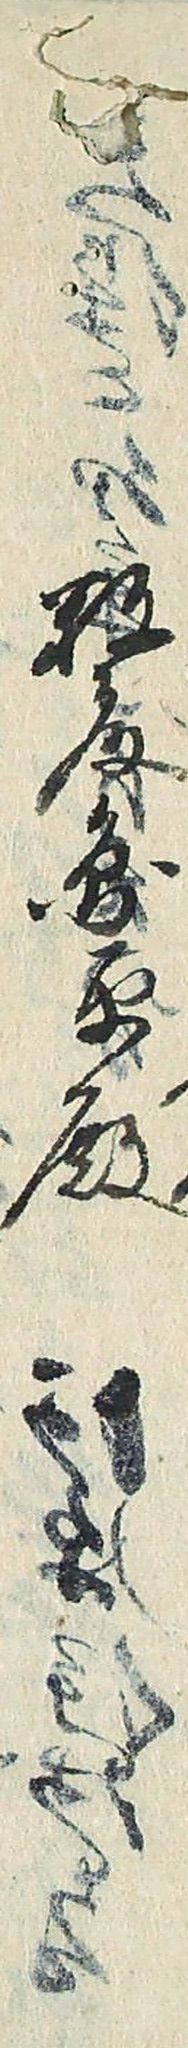数藤円平殿
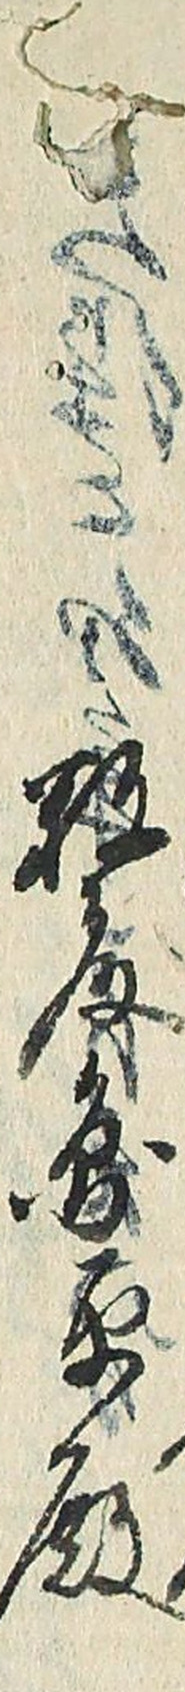数藤円平殿

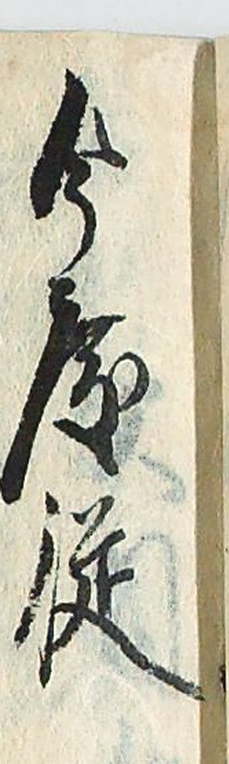今度従
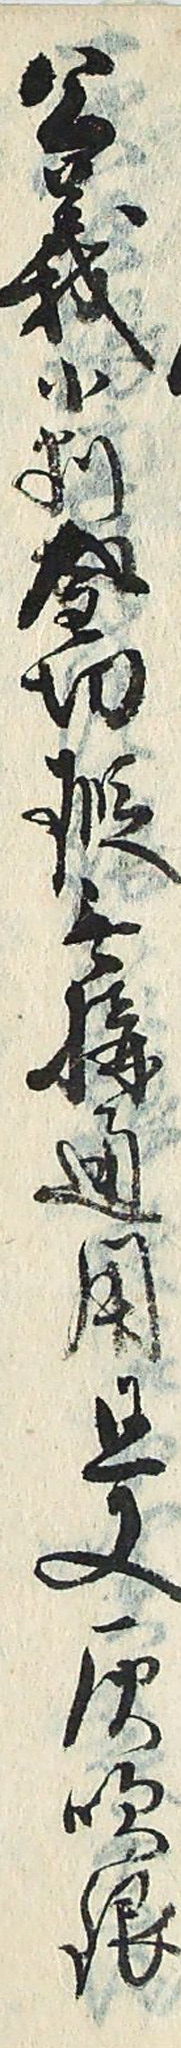公儀小判金切鍛無構通用且又灰吹銀
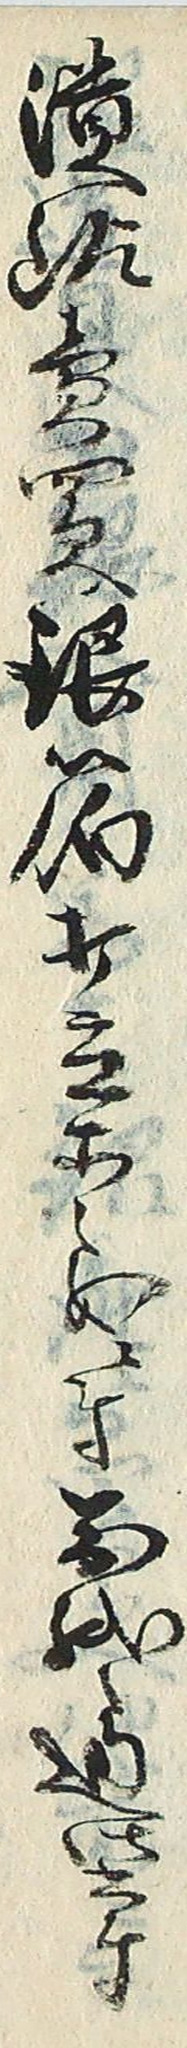潰銀売買銀箔打立等之義に付別紙之通御書付
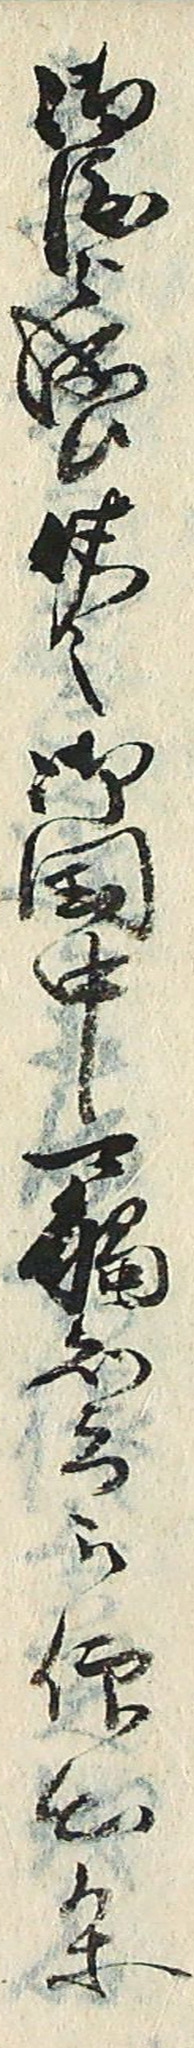御渡被成候依之御国中可触知旨被仰出条
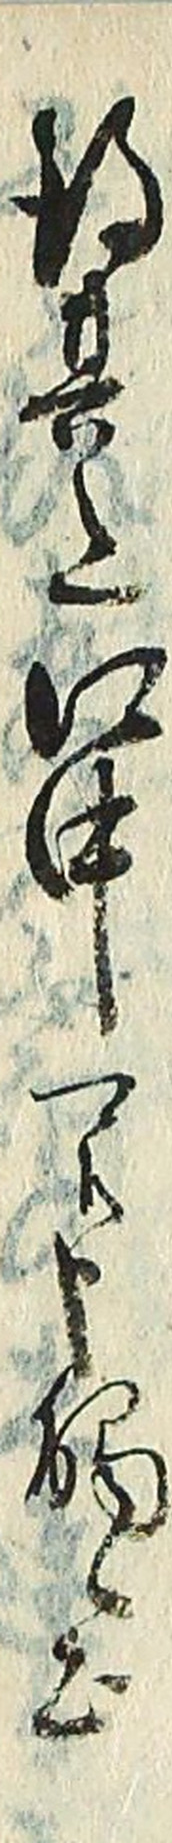得其意郷中可被申触候以上
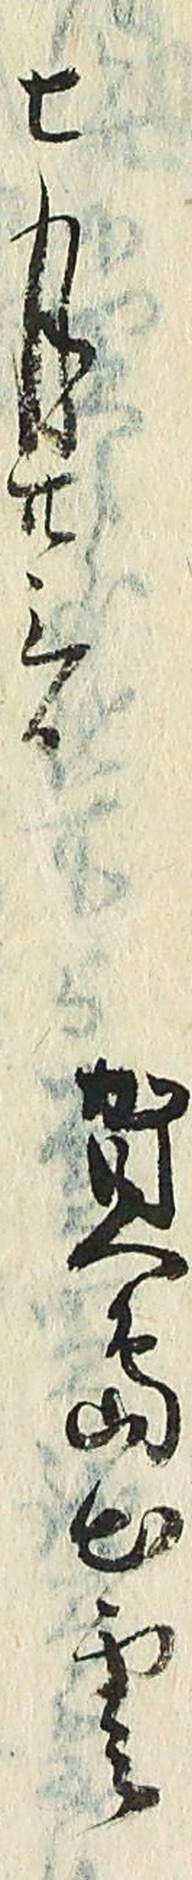七月廿三日賀島出雲
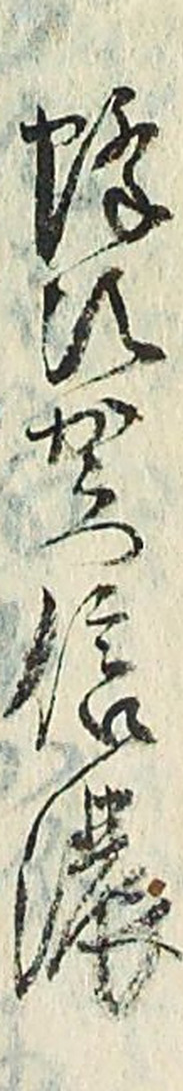蜂須賀信濃
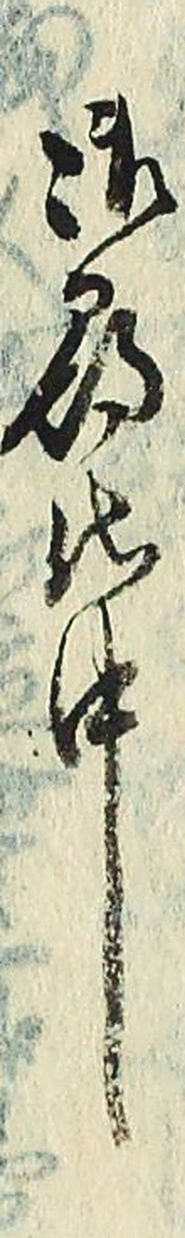御郡代中
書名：諸御用御□受書控
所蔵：鳴門教育大学 Naruto University of Education
